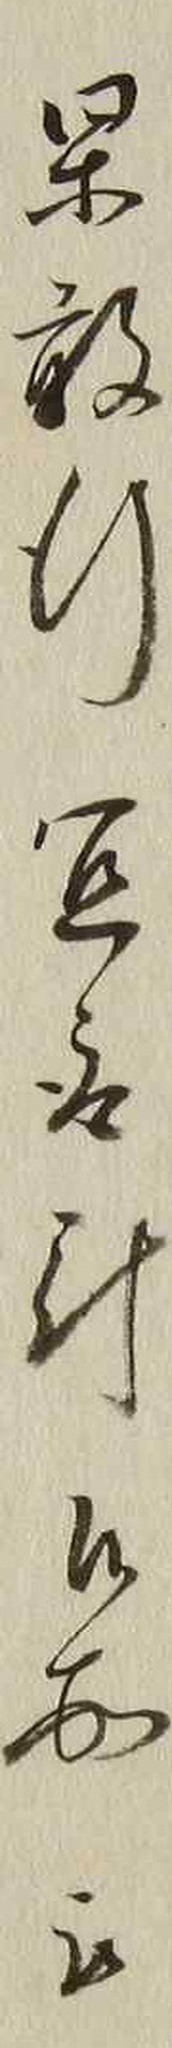果敢行宜取計候段被
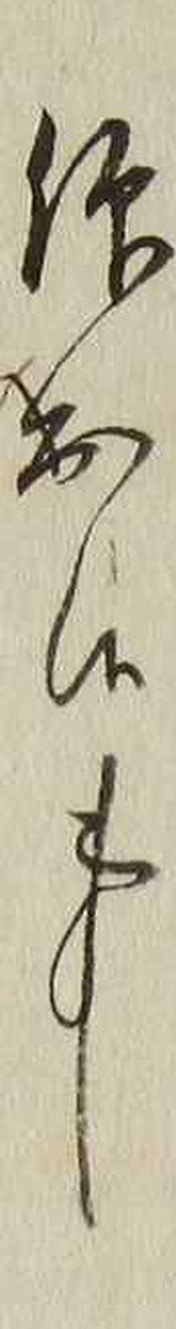仰出候事
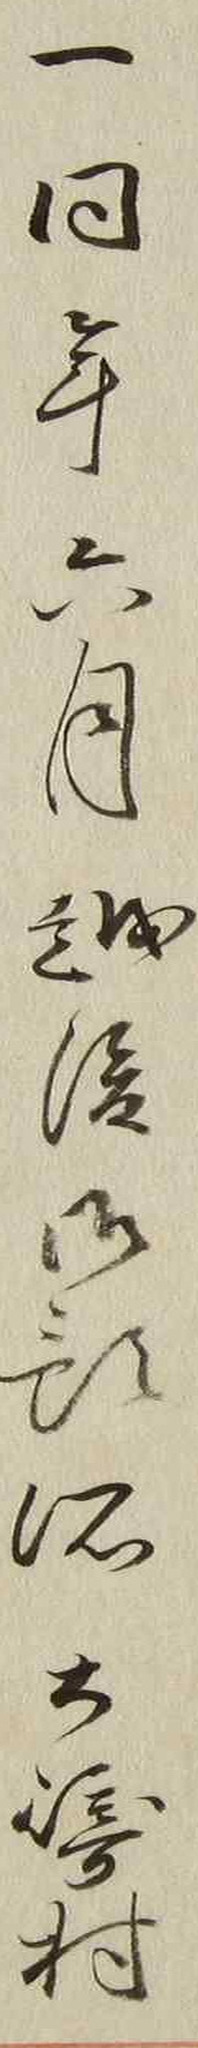一同年六月越後御預所大崎村
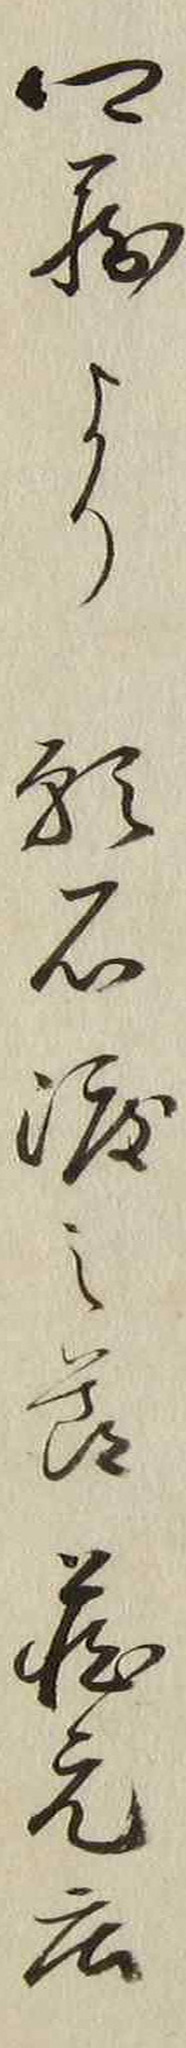郷蔵より願石渡之節蔵元庄
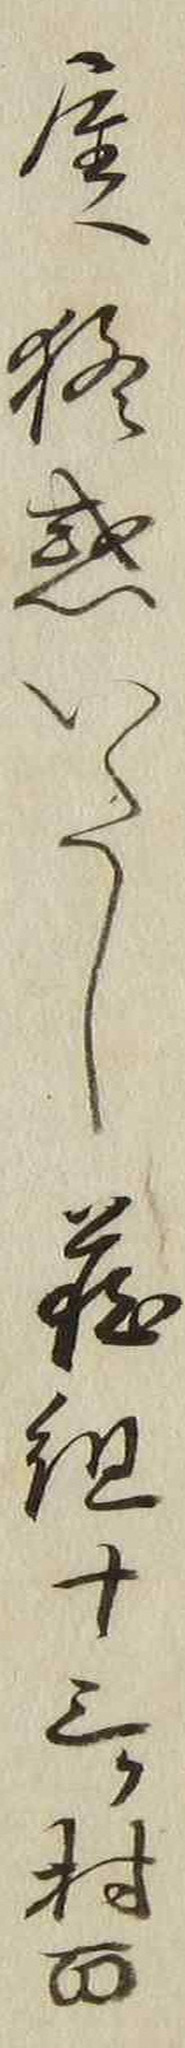屋へ疑惑いたし蔵組十三ヶ村百
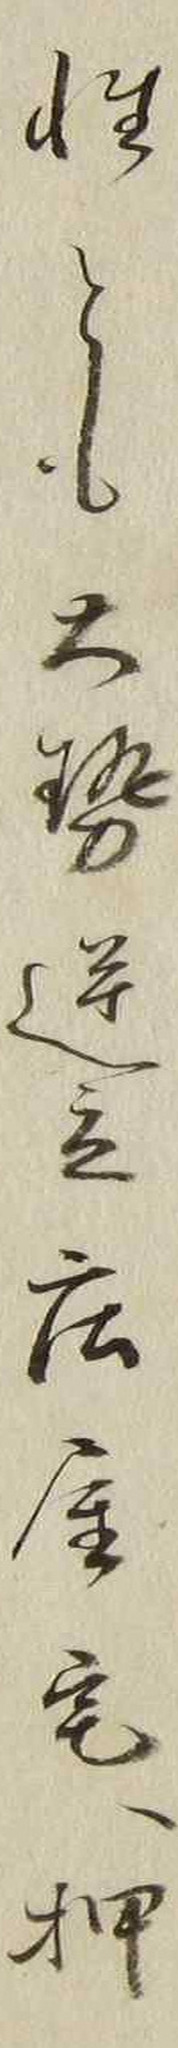姓とも大勢逆立庄屋宅へ押
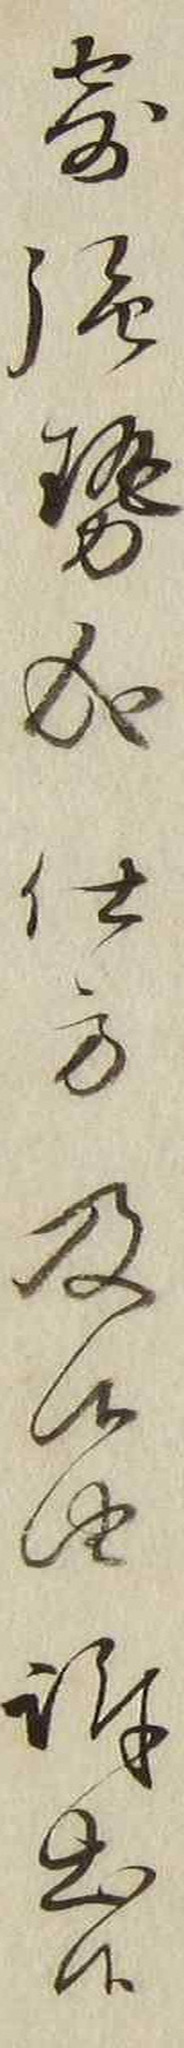寄強勢成仕方及候由訴出候
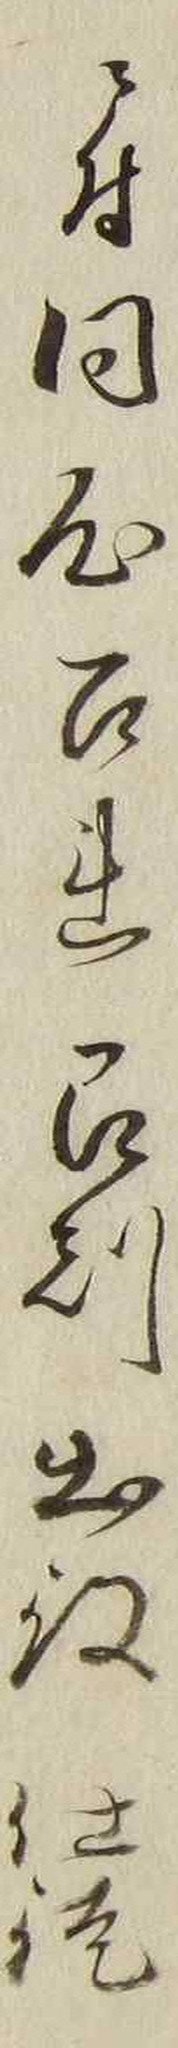ニ付同心召連即刻出役仕徒

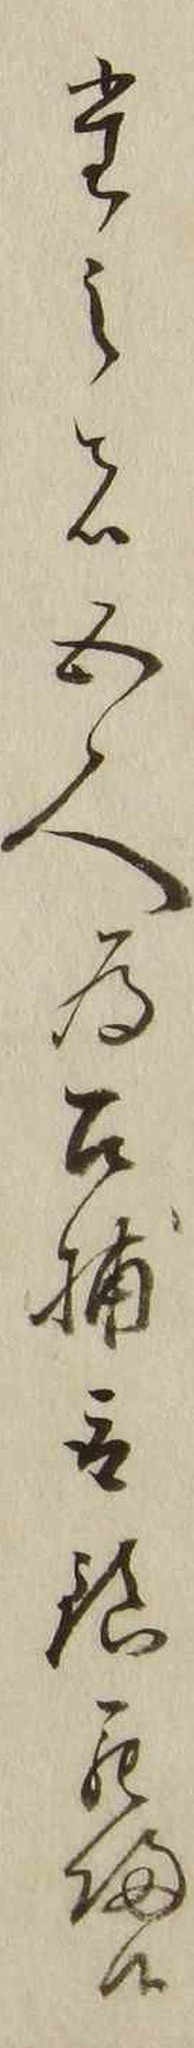党之者五人為召捕取鎮罷帰候
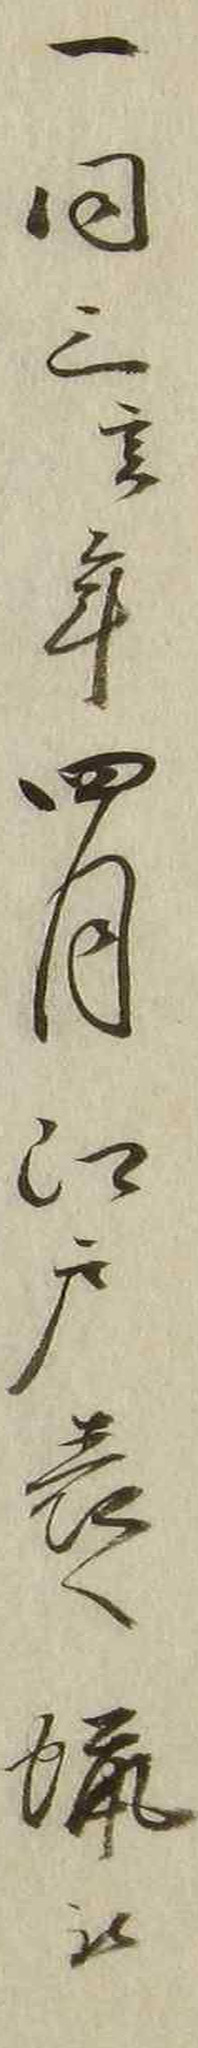一同三亥年四月江戸表へ蝋被
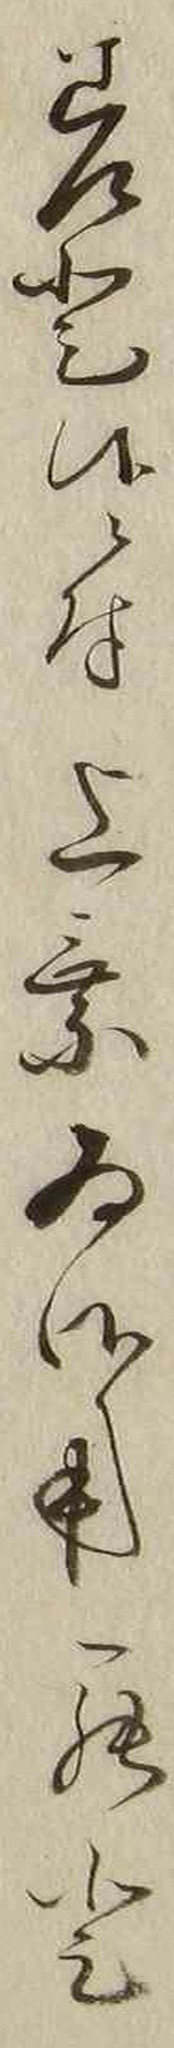差登候ニ付上乗為御用罷登
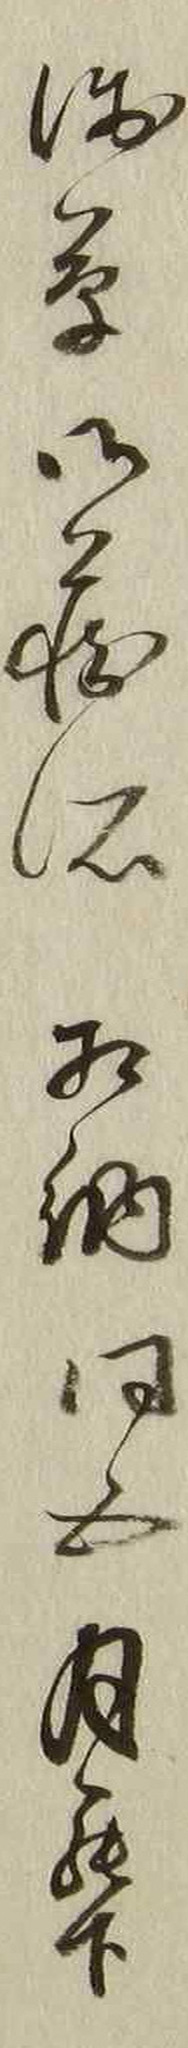浅草御蔵所相納同五月罷下
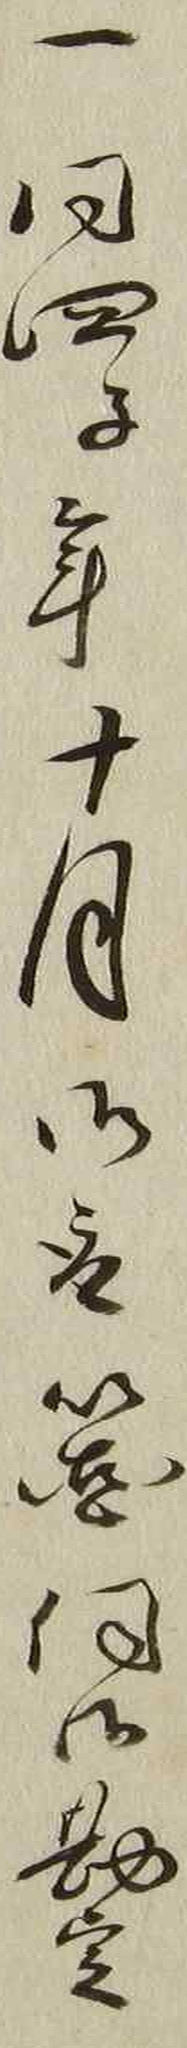一同四子年十月御取箇伺御勘定
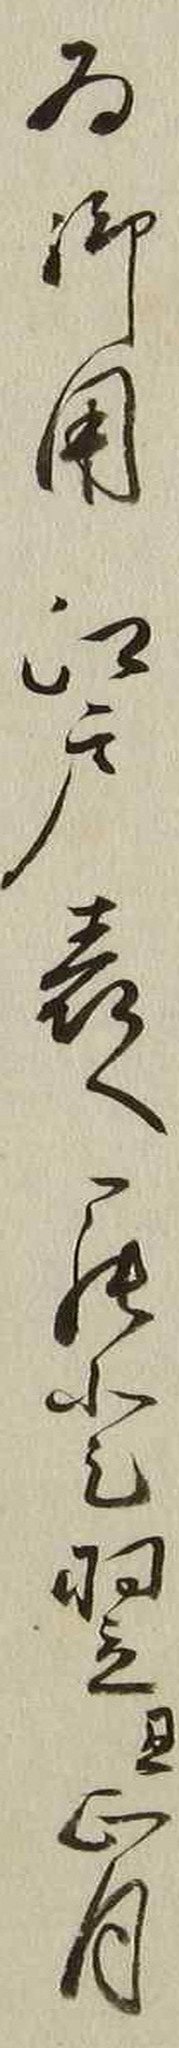為御用江戸表へ罷登翌丑正月
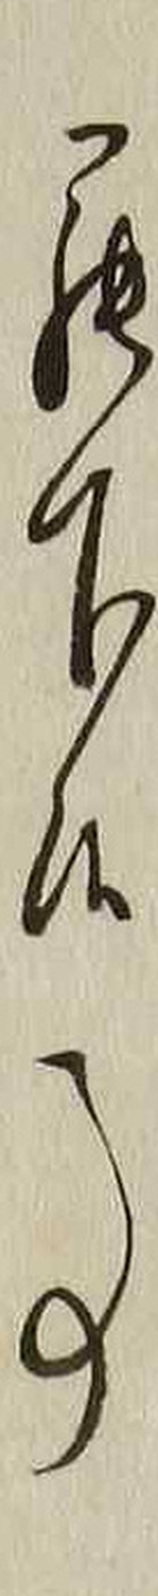罷下候事
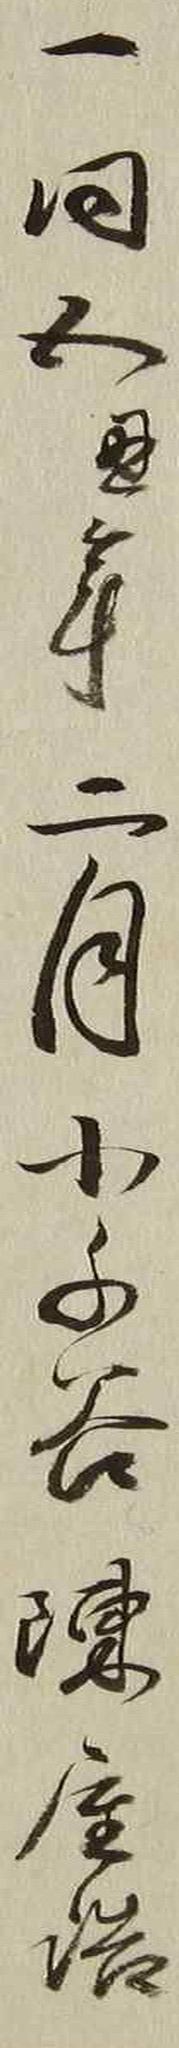一同五丑年二月小千谷陣屋詰
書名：諸士系譜　巻之52　に之部3
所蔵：会津若松市立会津図書館
